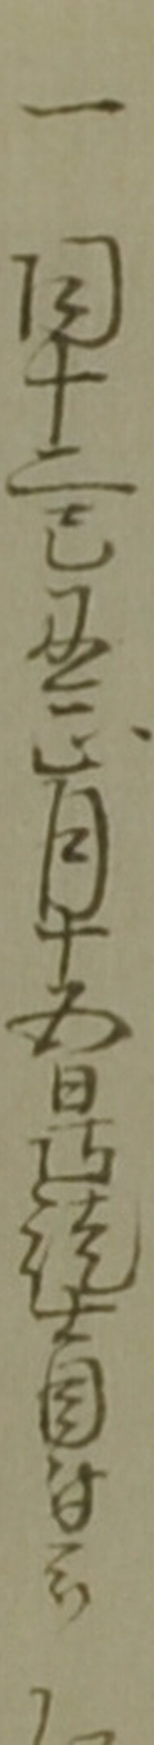一同十二己丑正月十五日御徒士目付被仰付
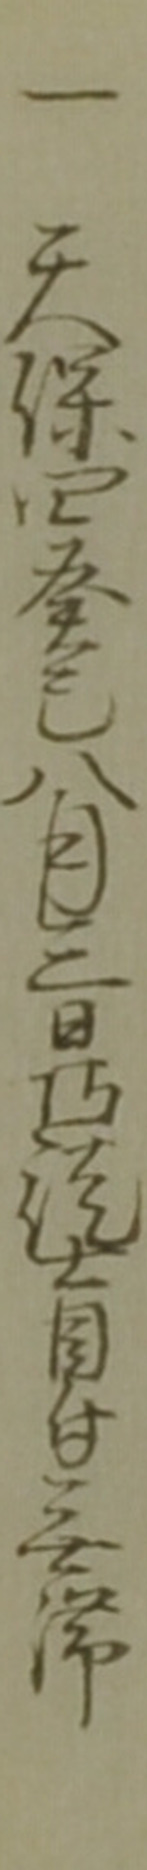一天保四癸巳八月三日御徒士目付無滞
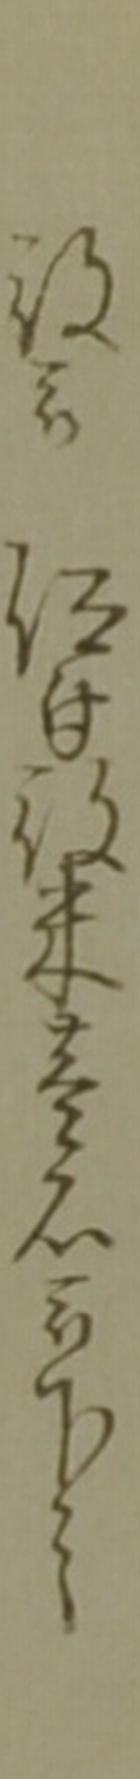役被仰付役来壱石被下之
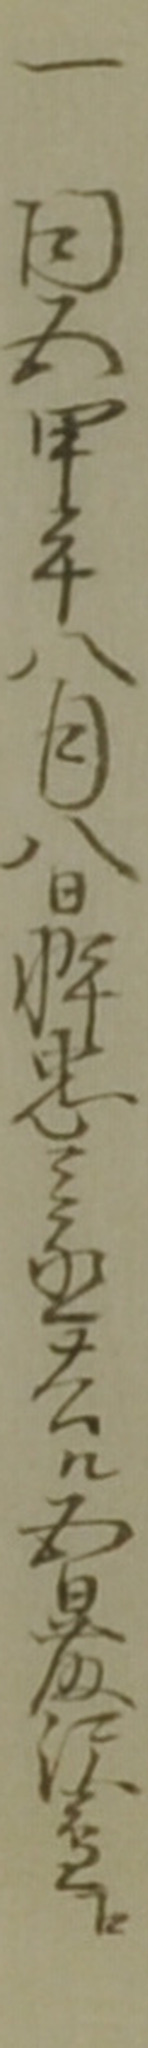一同五甲午八月八日忰忠之丞去ル五日藤沢辺江
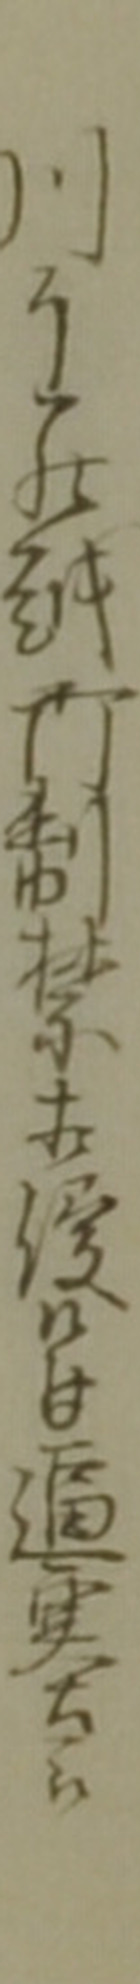川干罷越御制禁相侵候付逼塞被
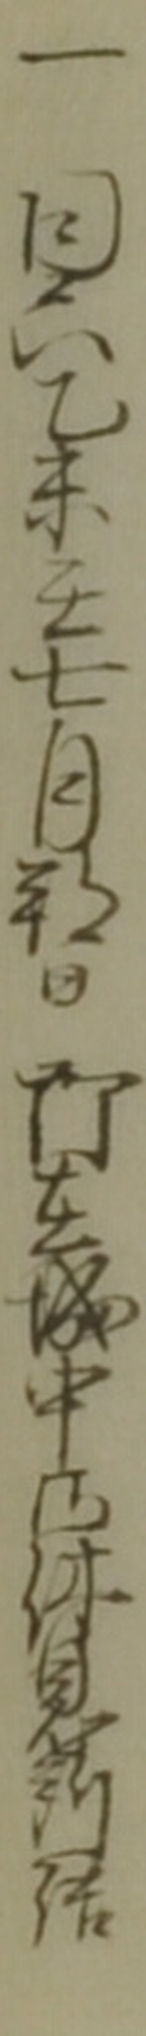一同六乙未閏七月朔日御在城中御休目付所詰
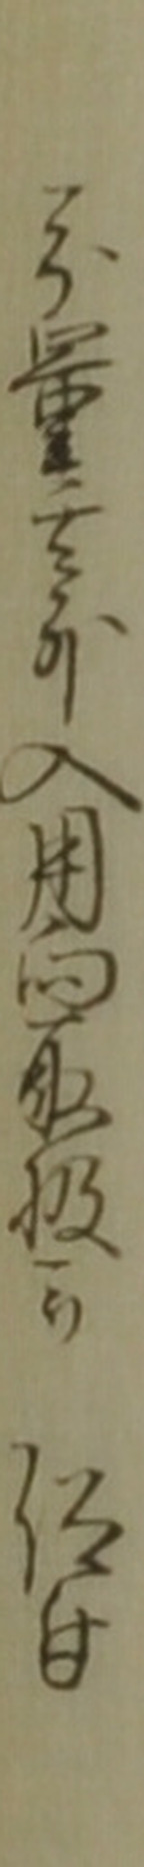分量其外入用向取扱被仰付
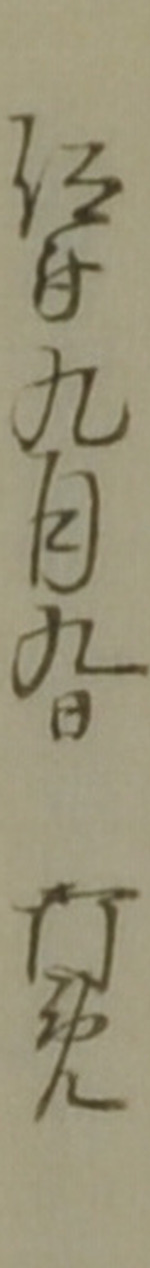仰付九月九日御免

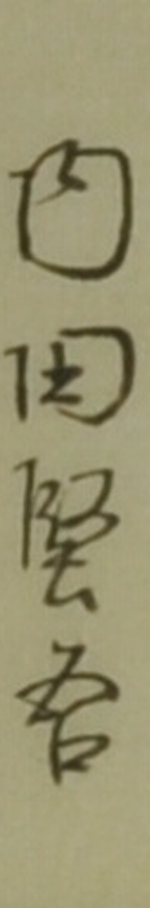内田賢吾
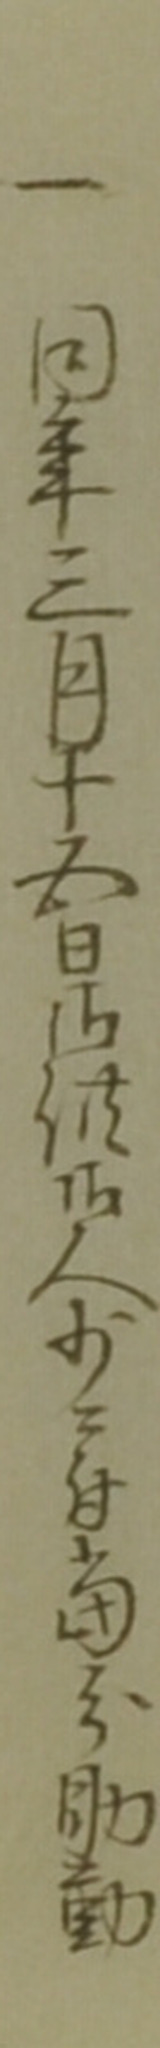一同年三月十五日御供御人少ニ付当分助勤
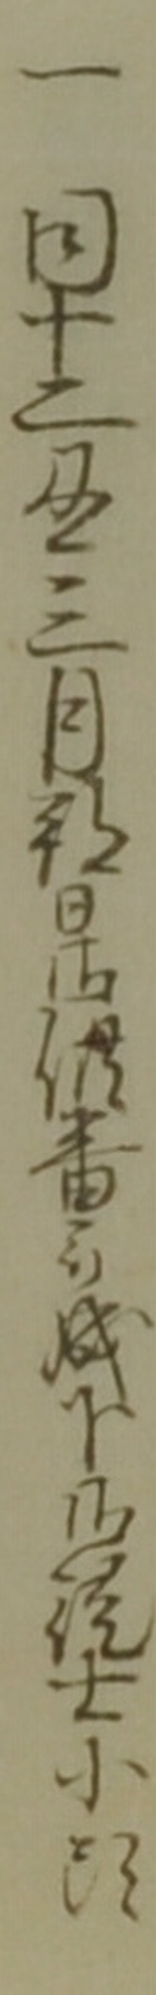一同十二丑三月朔日御供番被成下御徒士小頭
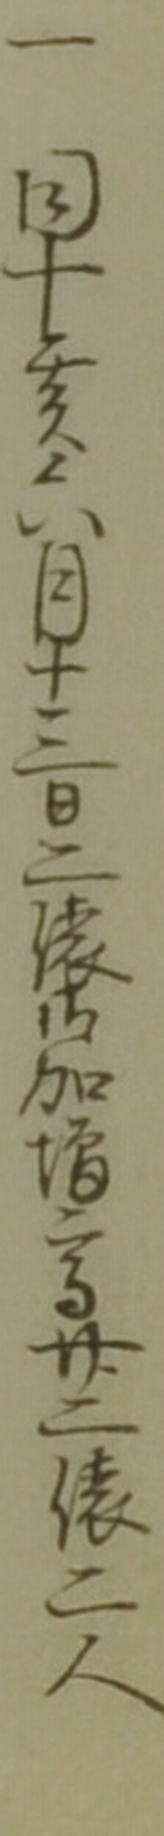一同十亥六月十三日二俵御加増高廿二俵二人
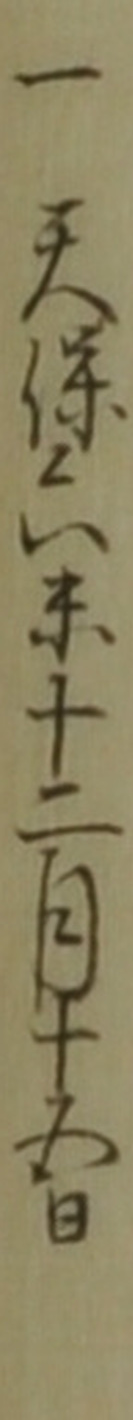一天保六未十二月十五日
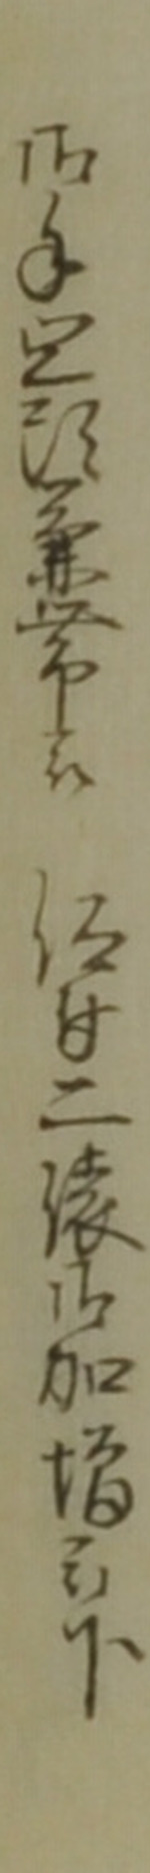御手廻頭兼帯被仰付二俵御加増被下
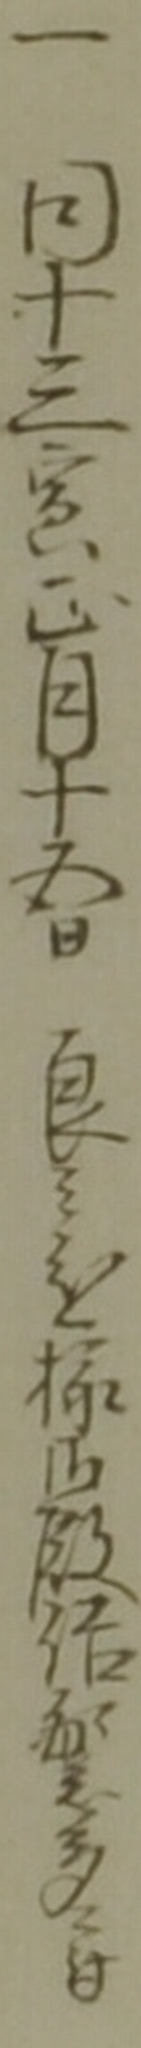一同十三寅正月十五日良之進様御殿詰繁多ニ付
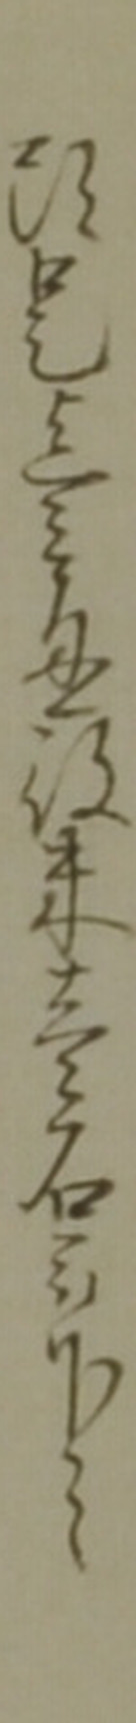頭是迄之通役来壱石被下之
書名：無足諸士勤仕録（五）
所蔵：伊那市立高遠町図書館・合同会社AMANE
